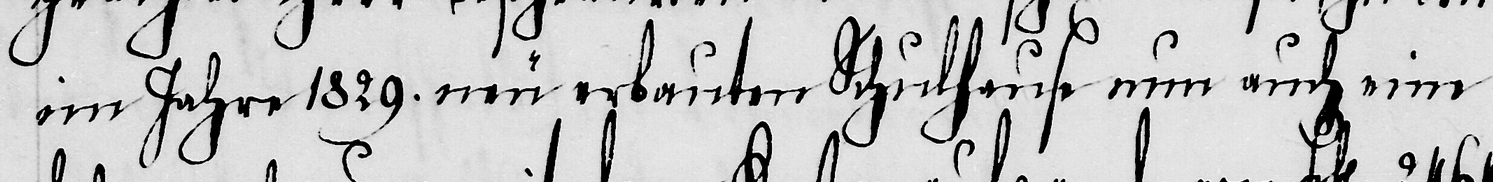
im Jahre 1829. neu erbauten Schulhause nun auch eine
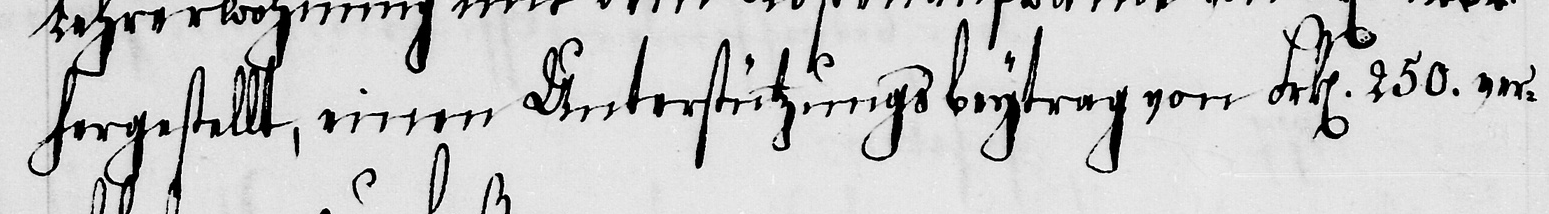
hergestellt, einen Unterstützungsbeytrag von Frk[en]. 250. ver¬
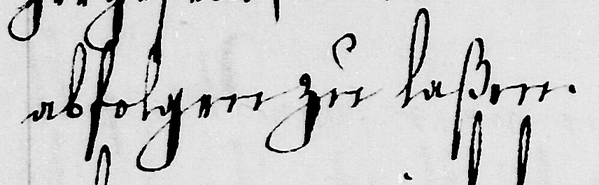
abfolgen zu laßen.
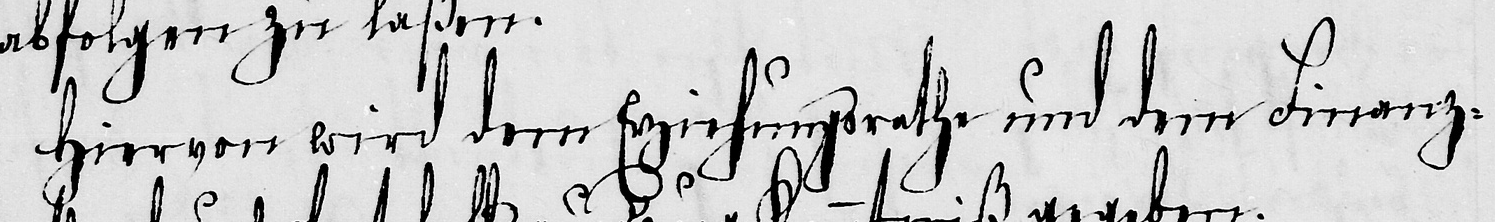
Hiervon wird dem Erziehungsrathe und dem Finanz¬
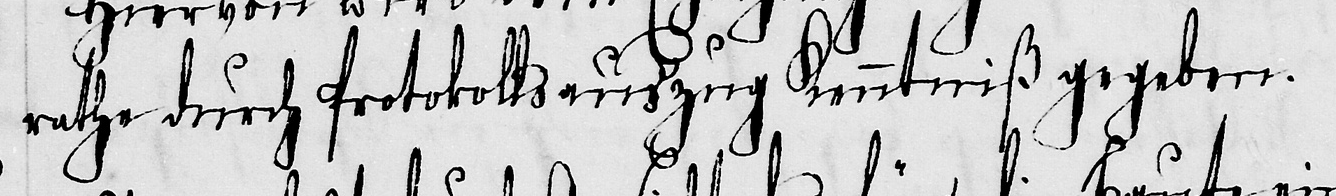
rathe durch Protokollsauszug Kenntniß gegeben.
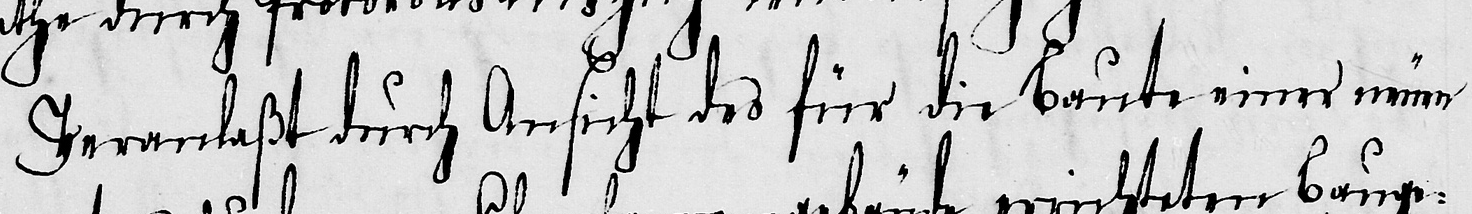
Veranlaßt durch Ansicht des für die Baute einer neuen
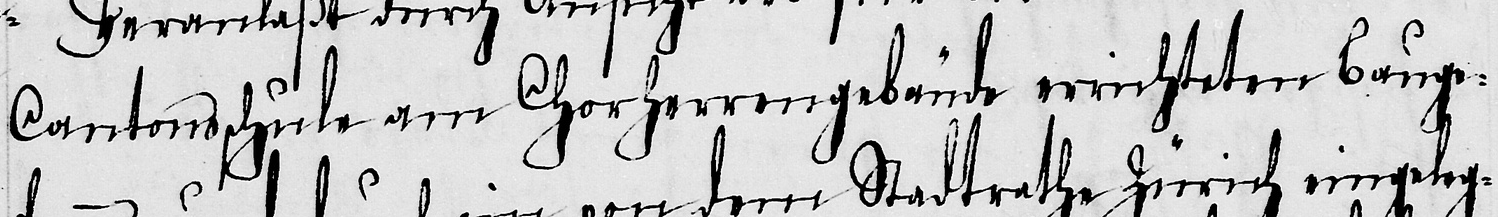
Cantonsschule am Chorherrengebäude errichteten Bauge¬
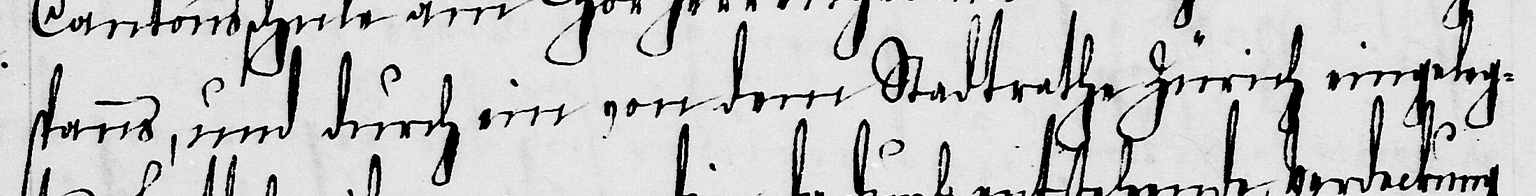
spanns, und durch ein von dem Stadtrathe Zürich eingeleg¬
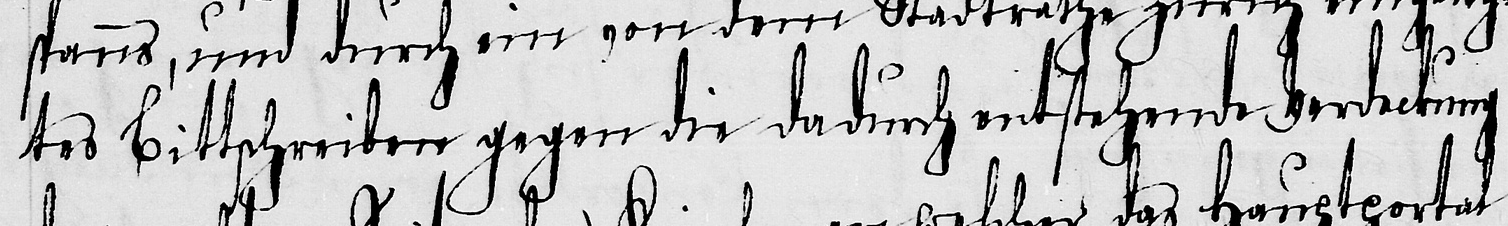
tes Bittschreiben gegen die dadurch entstehende Verdeckung
